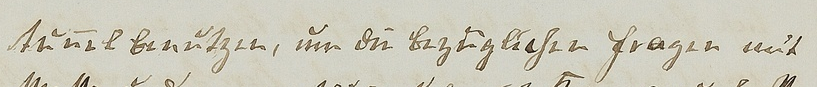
tunnel benutzen, um die bezüglichen Fragen mit
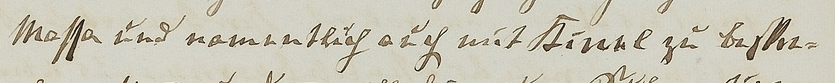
Massa und namentlich auch mit Kinel zu bespre-
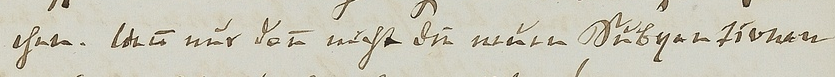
chen. Wenn nur dann nicht die neuen Subventionen
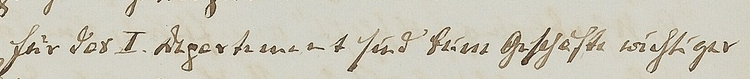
Für das I. Departement sind keine Geschäfte wichtiger
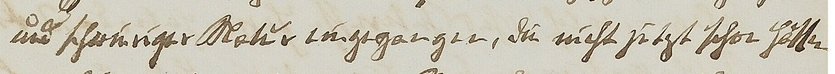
und schwieriger Natur eingegangen, die nicht jetzt schon hätten
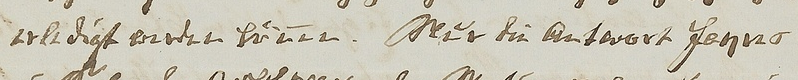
erledigt werden können. Nur die Antwort Favres
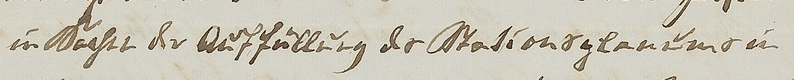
in Sachen der Auffüllung des Stationsplanums in
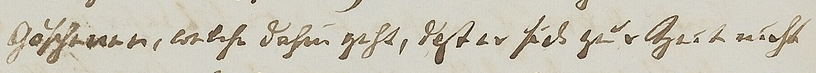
Göschenen, welche dahin geht, daß er sich zur Zeit nicht
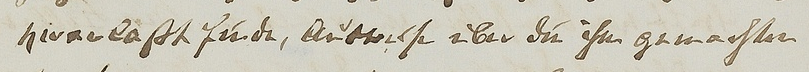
veranlaßt finde, Ausweise über die ihm gemachten
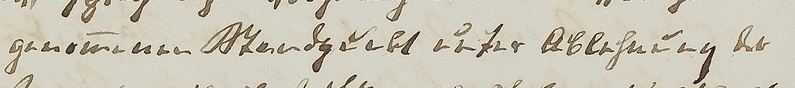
genommenen Standpunkt unter Ablehnung der
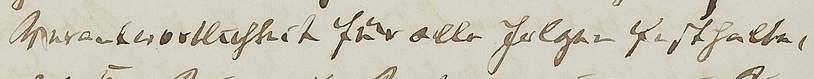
Verantwortlichkeit für alle Folgen festhalte,
